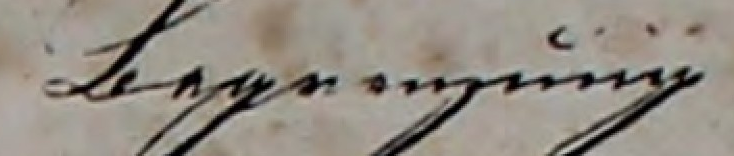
Begrenzung
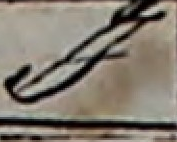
J.
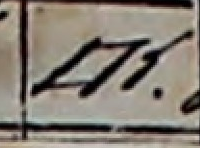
CK.
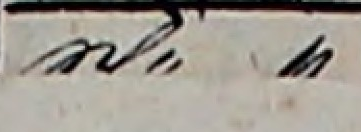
???
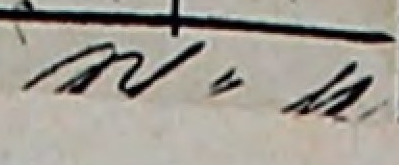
???
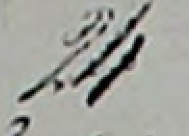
24
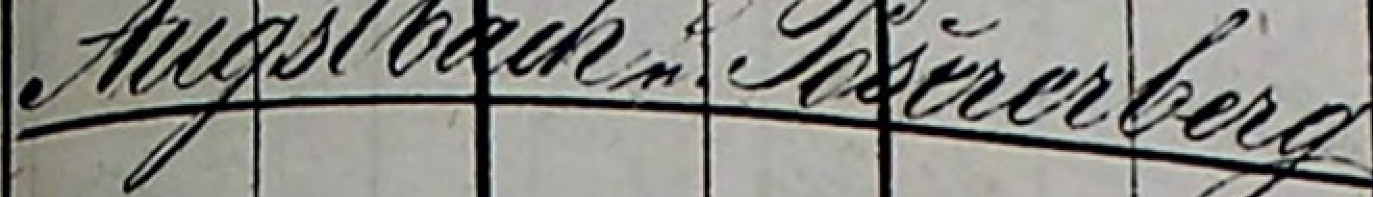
Augustbach u. Posererberg
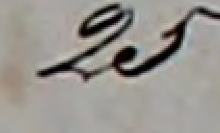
25
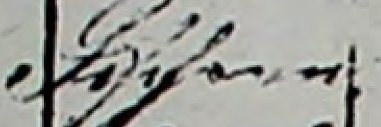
Fischern
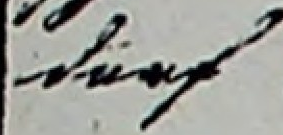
dorf
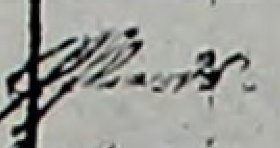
Pflinds
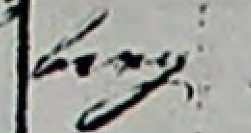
berg
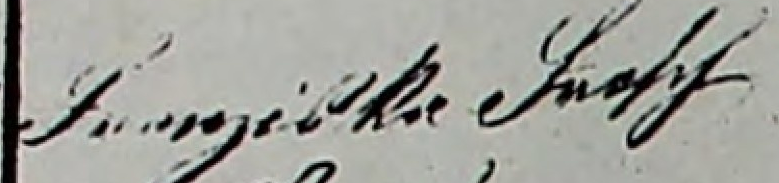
Franziska Frosch
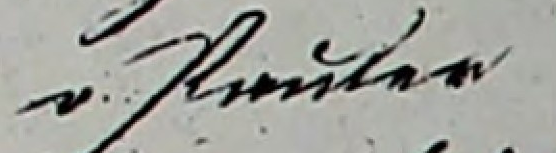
v. Pauler
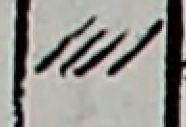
101
